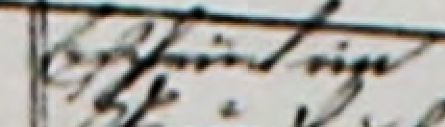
Esseint im
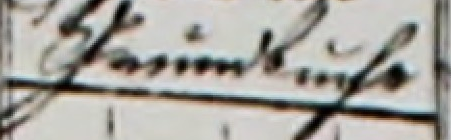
Grundbuche
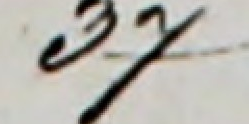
37
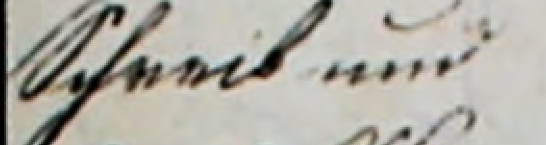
Schreib und
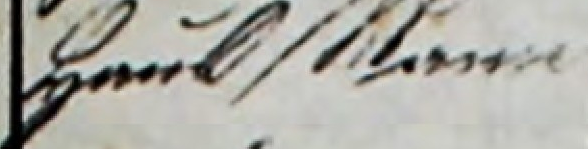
Haus Name
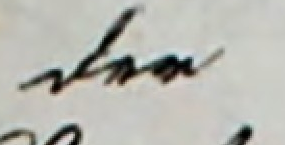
der
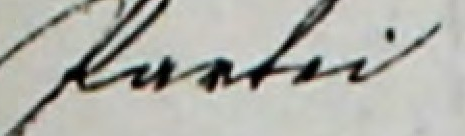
Partei.
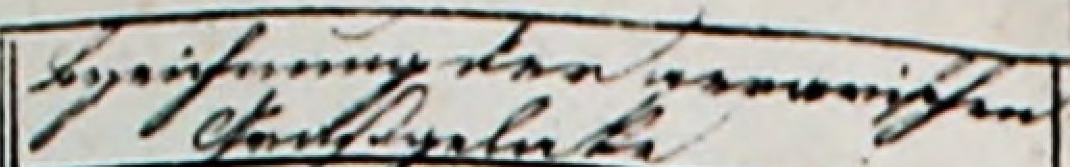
Bezeichnung der erarischen
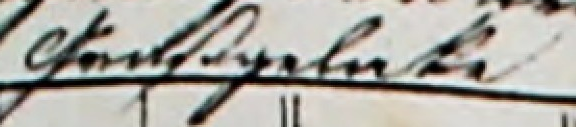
Graßgelake
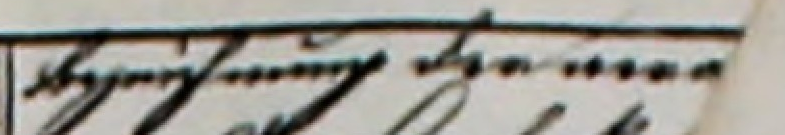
Bezeichnung der erarischen
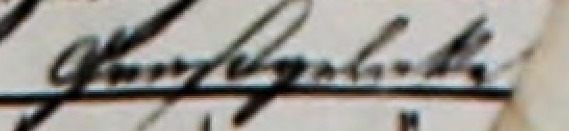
Graßgelake
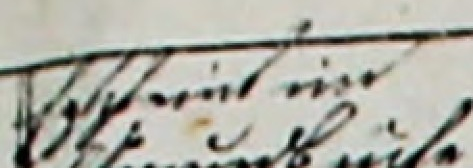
Esseint im
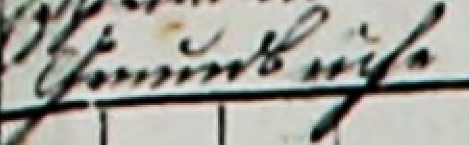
Grundbuche
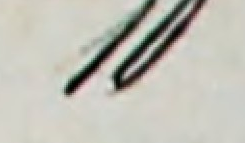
10
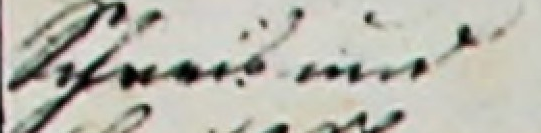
Schreib und
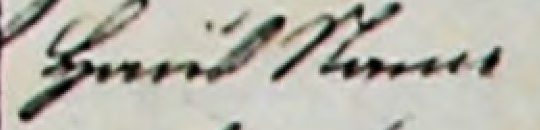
Haus Name
